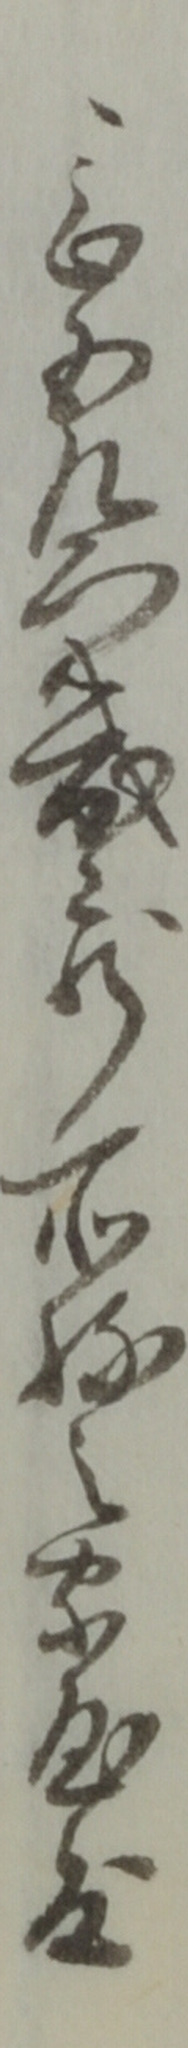甚五左衛門歳蔵所持之家屋敷
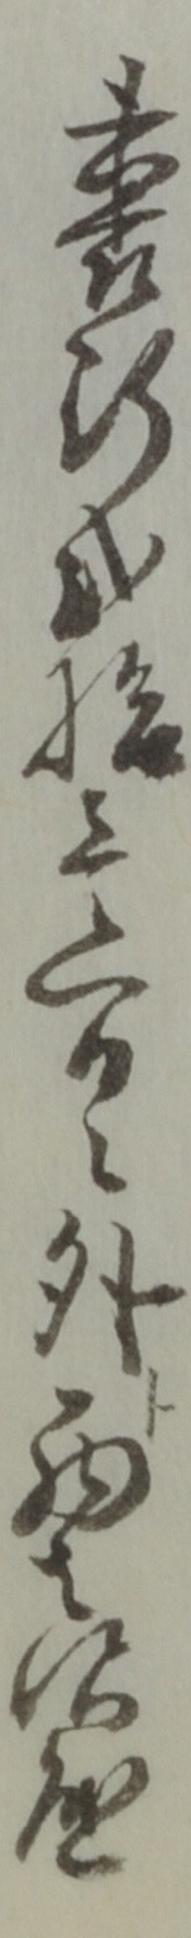裏行弐拾壱間ニ外ト西は沢底
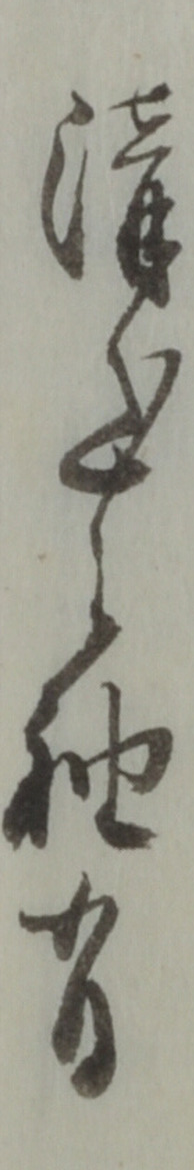溝迄之袖有
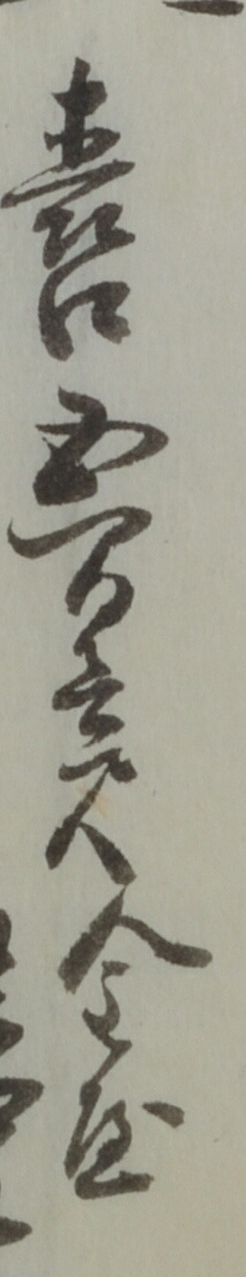一表口五間壱尺金屋
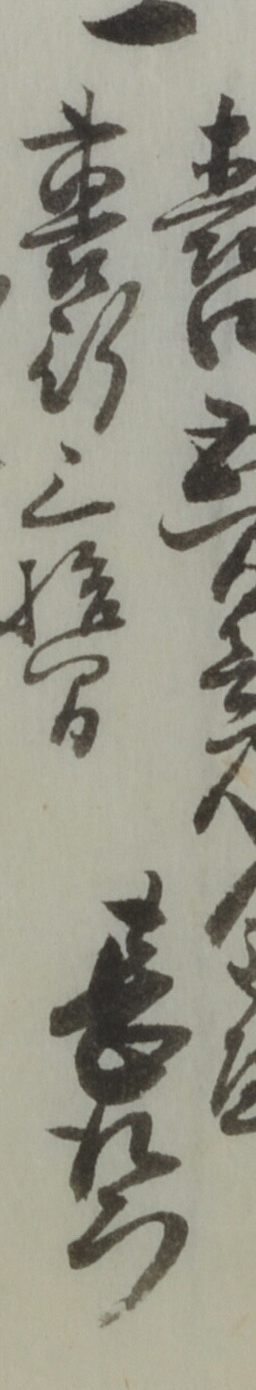裏行三拾間甚左衛門
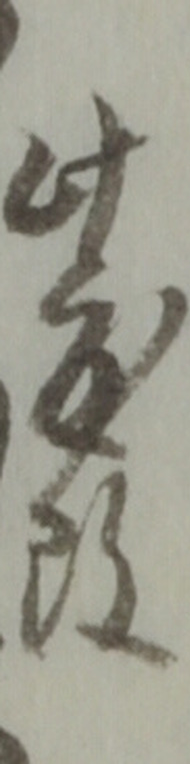此度改
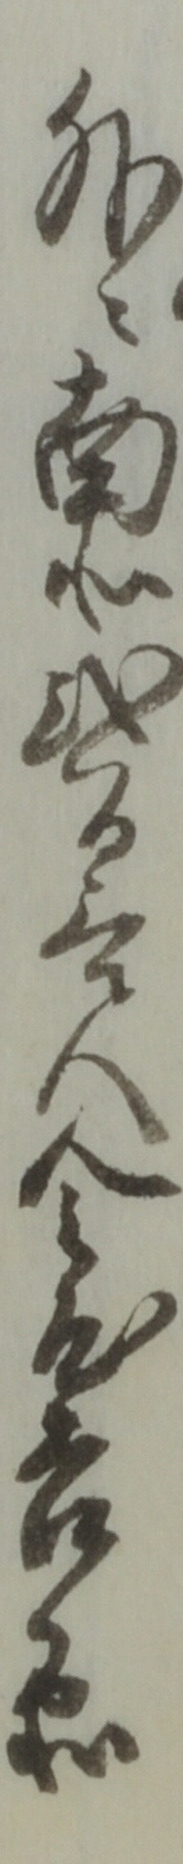外ニ南北弐間壱尺金屋吉兵衛
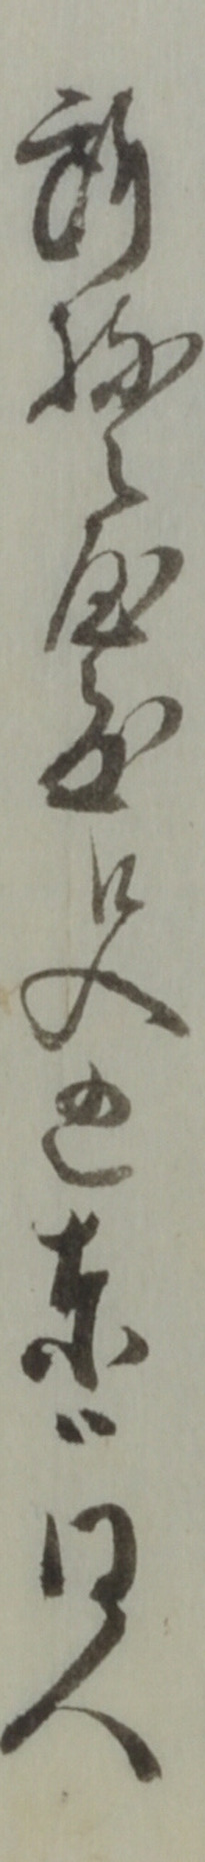所持之屋敷江入込東ハ同人
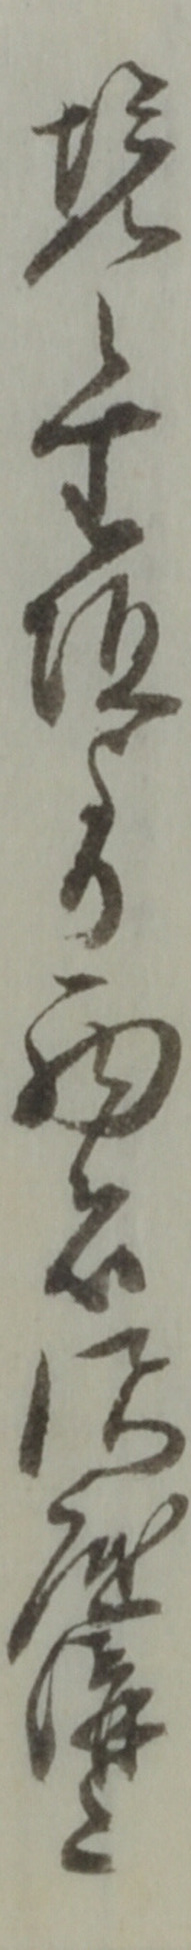境之生垣より西は沢底溝迄
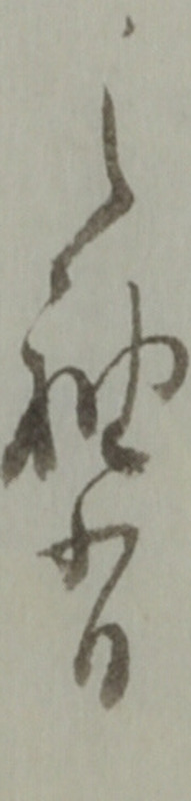之袖有
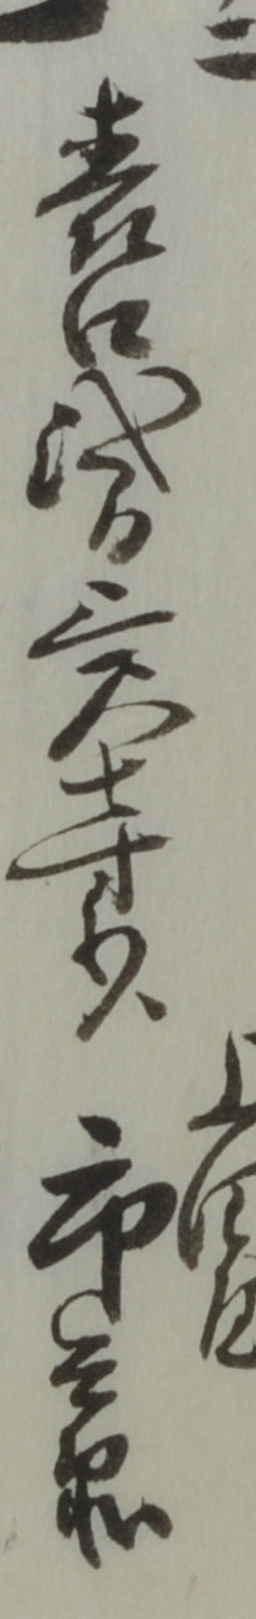一表口弐間三尺七寸五分市兵衛
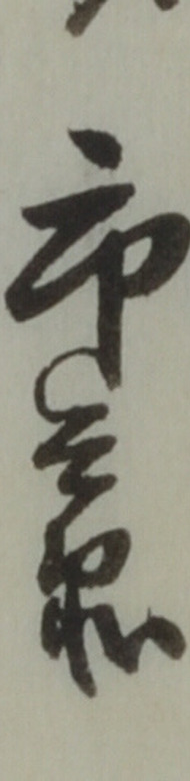左兵衛
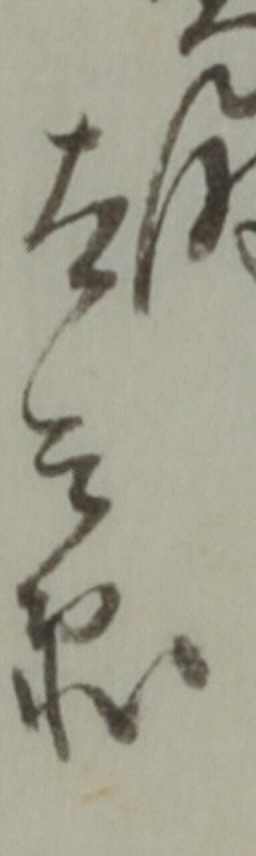左兵衛
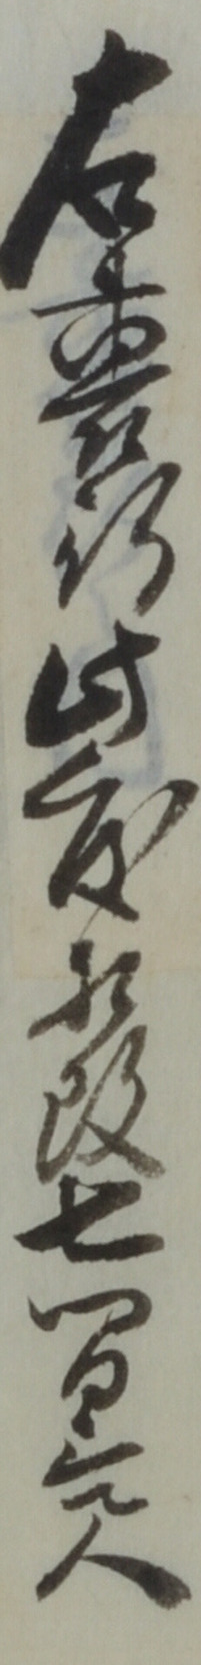右裏行此度相改七間三尺
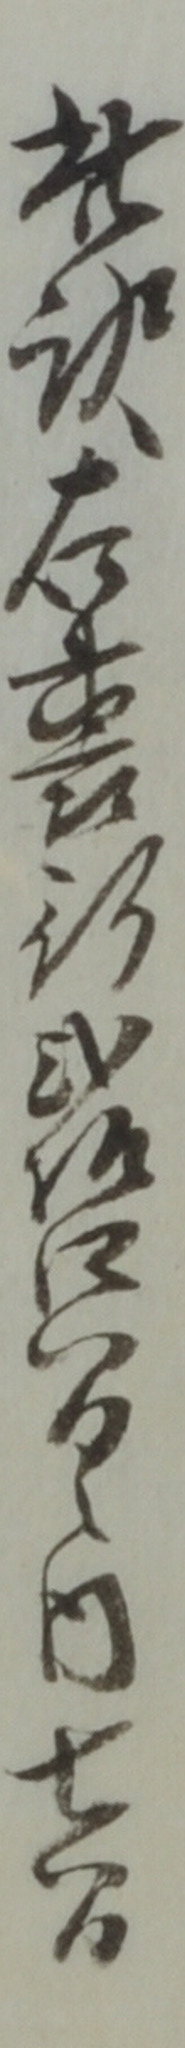此訳右裏行弐拾四間之内七間
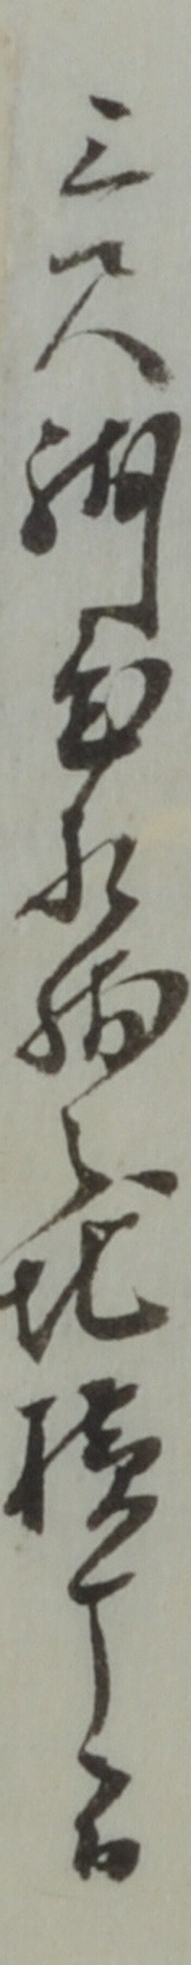三尺残置相残之地横丁ニ而
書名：屋敷表口裏行書上
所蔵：伊那市立高遠町図書館・合同会社AMANE
